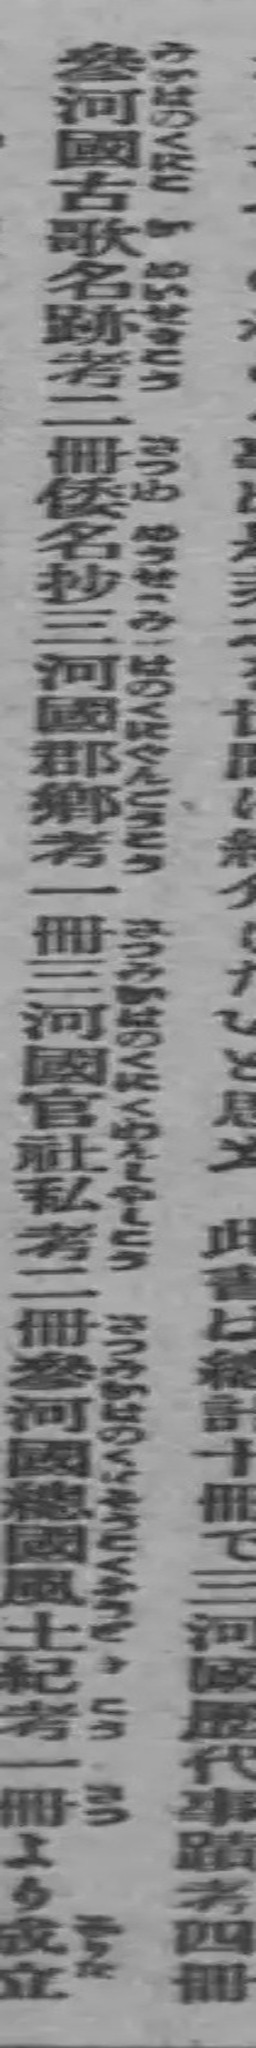参河国古歌名跡考二冊倭名抄三河国郡郷考一冊三河国官社私考二冊参河国総国風土記考一冊より成立
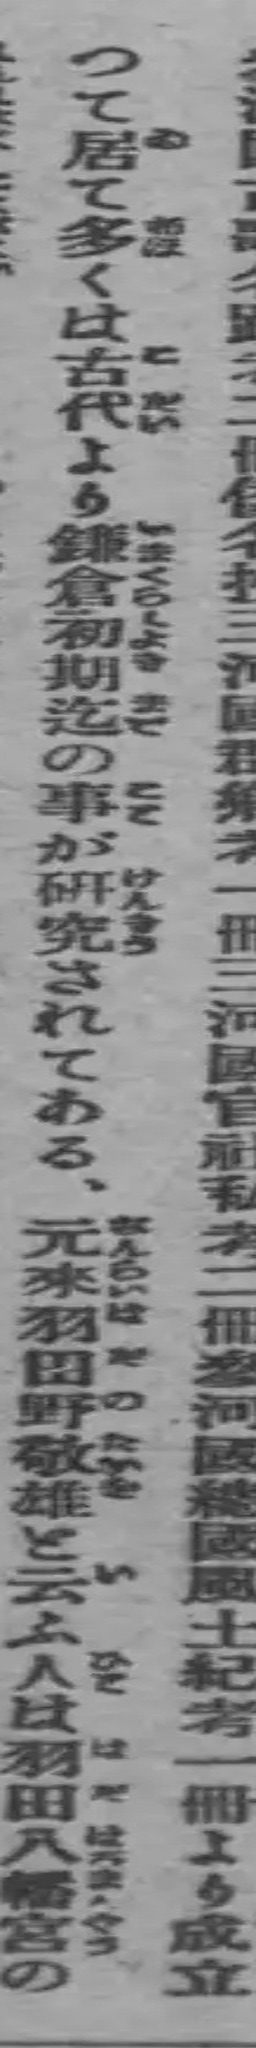つて居て多くは古代より鎌倉初期迄の事が研究されてある、元来羽田野敬雄と云ふ人は羽田八幡宮の
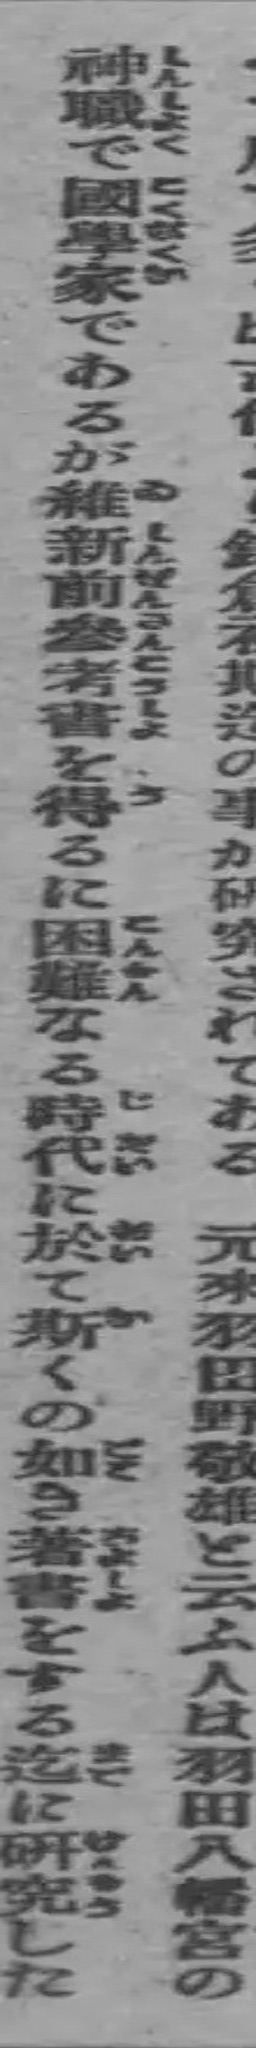神職で国学家であるが維新前参考書を得るに困難なる時代に於て斯くの如き著書をする迄に研究した

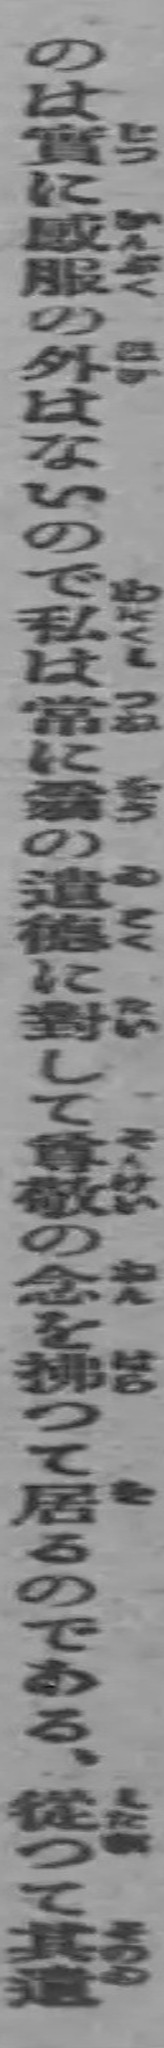のは実に感服の外はないので私は常に翁の遺徳に対して尊敬の念を払つて居るのである、従つて其遺
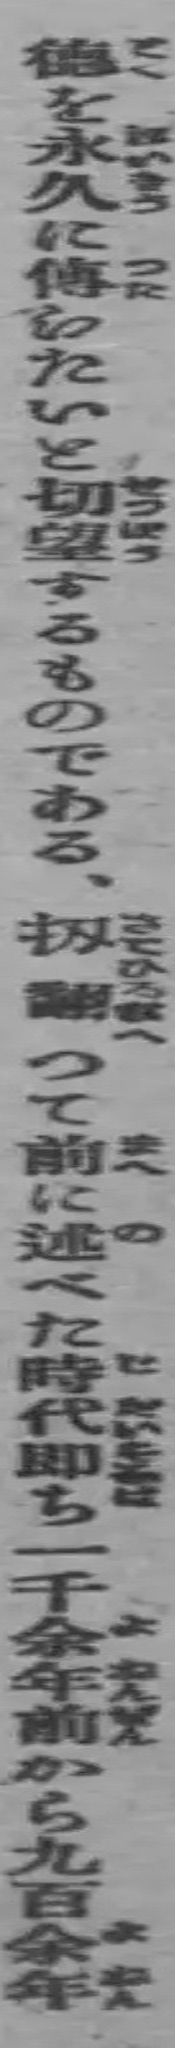徳を永久に伝えたいと切望するものである、扨翻つて前に述べた時代即ち一千余年前から九百余年
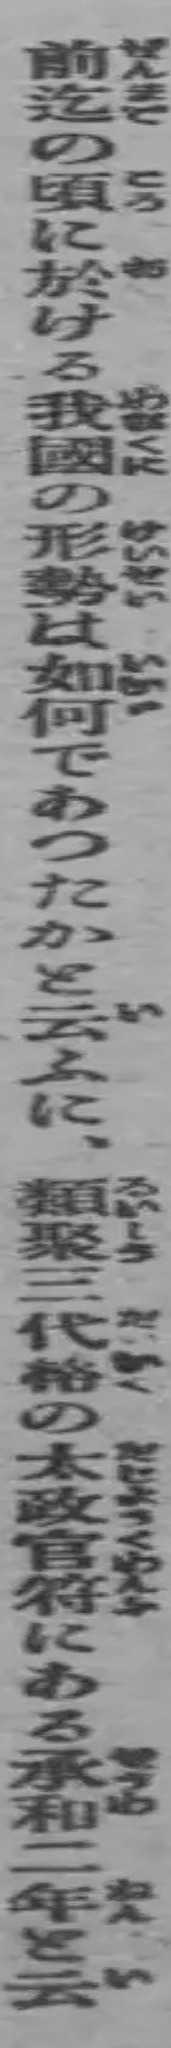前迄の頃に於ける我国の形勢は如何であつたかと云ふに、類聚三代格の太政官符にある承和二年と云
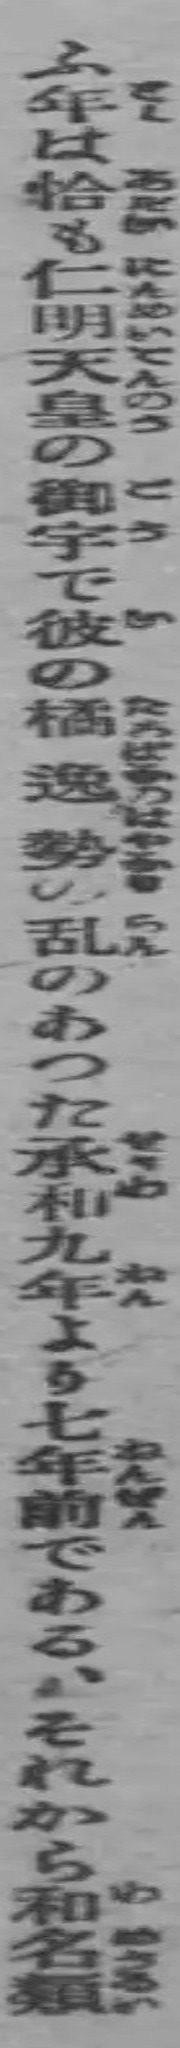ふ年は恰も仁明天皇の御宇で彼の橘逸勢の乱のあつた承和九年より七年前である、それから和名類
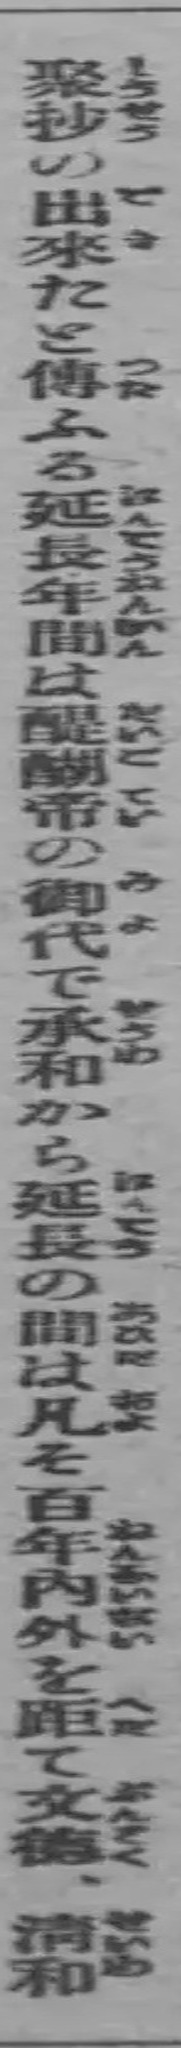聚抄の出来たと伝ふる延長年間は醍醐帝の御代で承和から延長の間は凡そ百年内外を距て文徳、清和
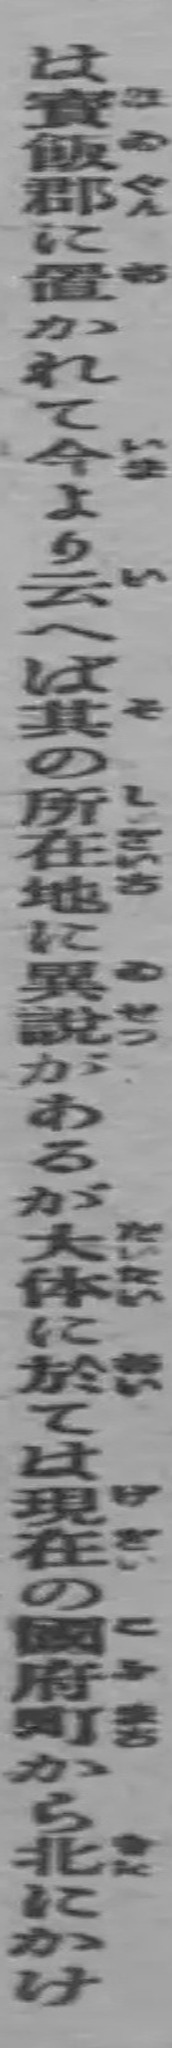は宝飯郡に置かれて今より云へば其の所在地に異説があるが大体に於ては現在の国府町から北にかけ
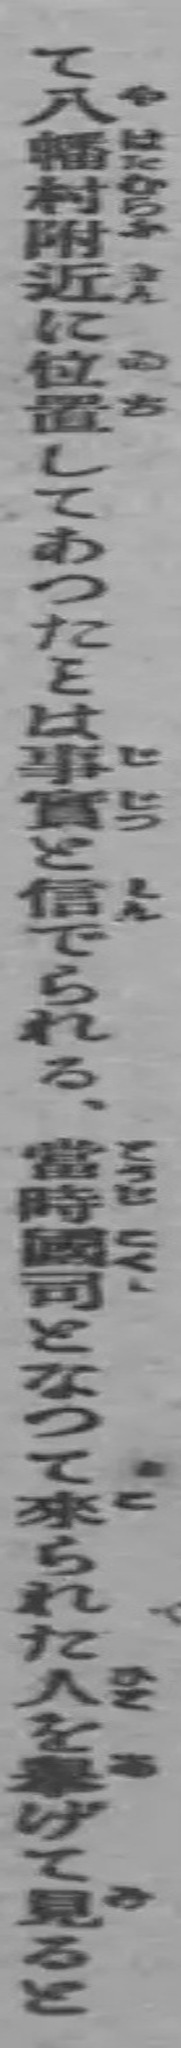て八幡村附近に位置してあつたことは事実と信でられる、当時国司となつて来られ人を挙げて見ると
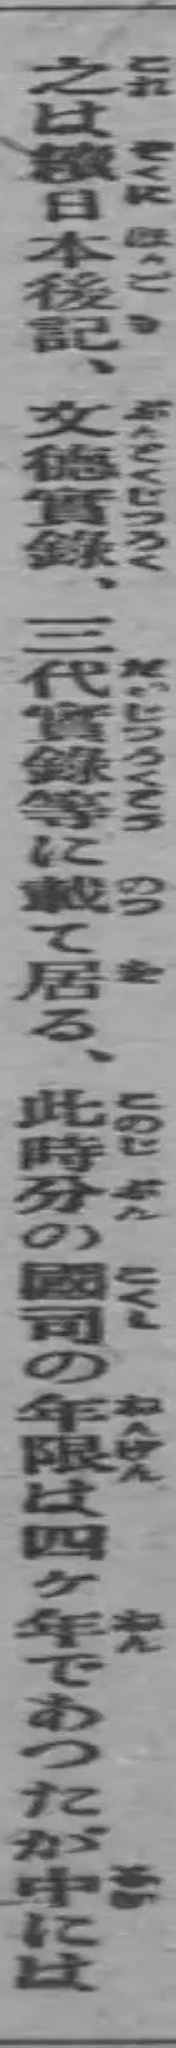之は続日本後記、文徳実録、三代実録等に載て居る、此時分の国司の年限は四ケ年であつたが中には
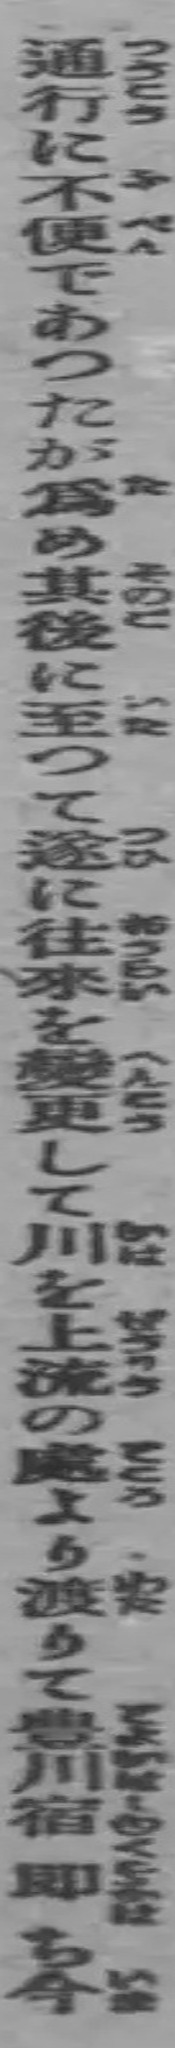通行に不便であつたが為め其後に至つて遂に往来を変更して川を上流の処より渡りて豊川宿即ち今
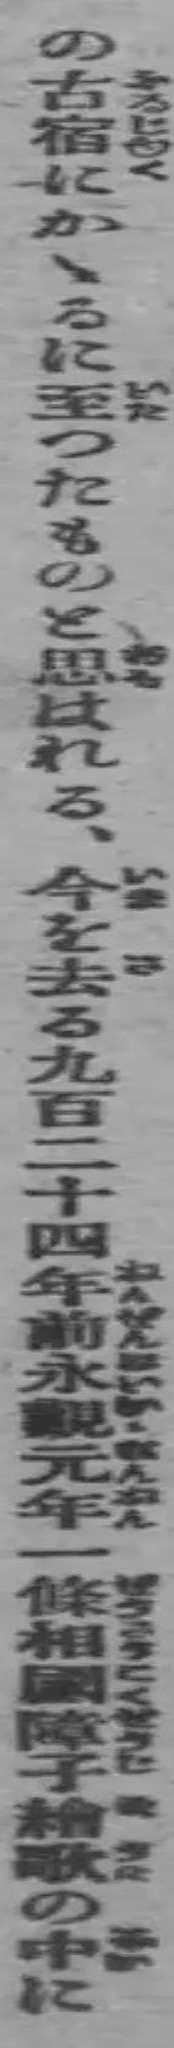の古宿にかゝるに至つたものと思はれる、今を去る九百二十四年前永観元年一条相国障子絵歌の中に
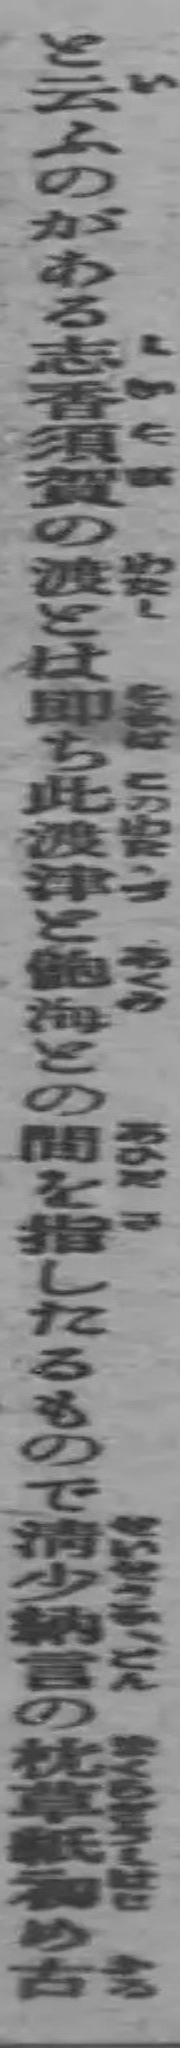と云ふのがある志香須賀の渡とは即ち此渡津と飽海との間を指したるもので清少納言の枕草紙初め古
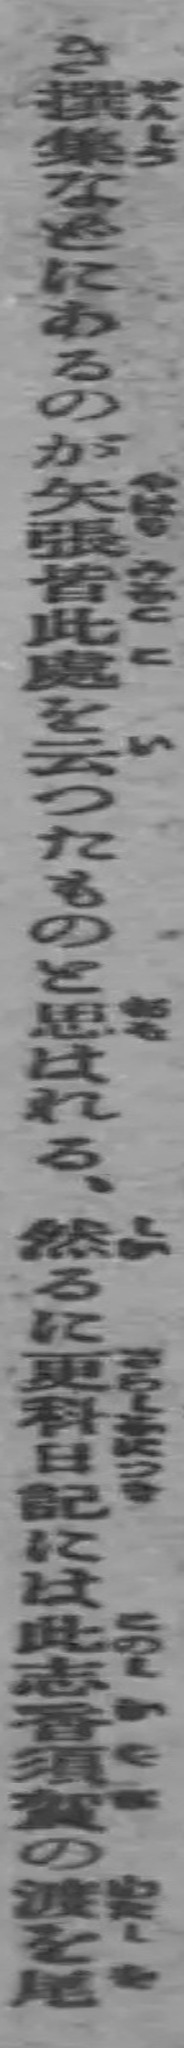き撰集などにあるのが矢張皆此処を云つたものと思はれる、然るに更級日記には此志香須賀の渡を尾
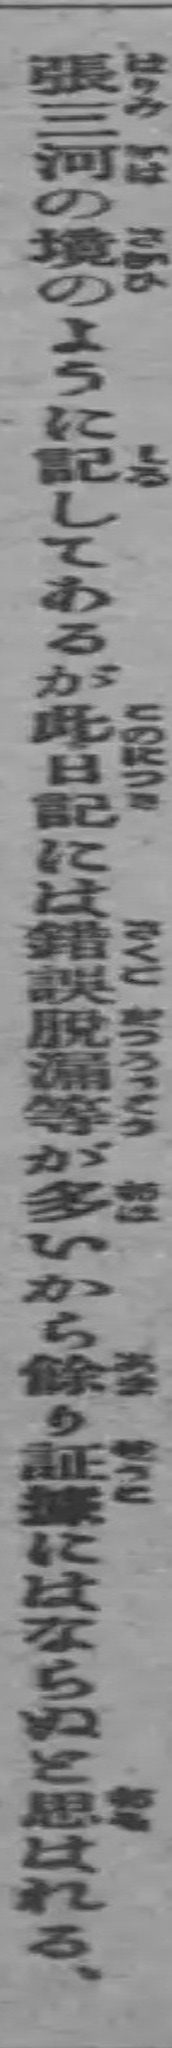張三河の境のように記してあるが此日記には錯誤脱漏等が多いから余り証拠にはならぬと思はれる、
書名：豊橋市史談
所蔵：国立国会図書館 National Diet Library, JAPAN
